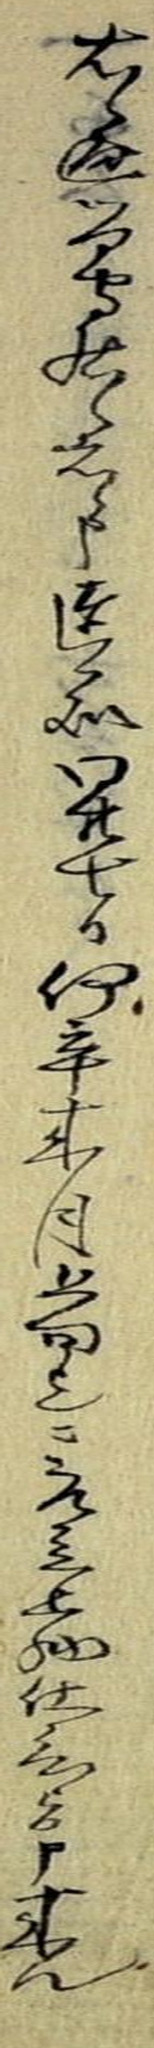右之通御留守居之者へ申達候処同廿七日何卒来月上旬迄に取立上納仕度旨申来ル
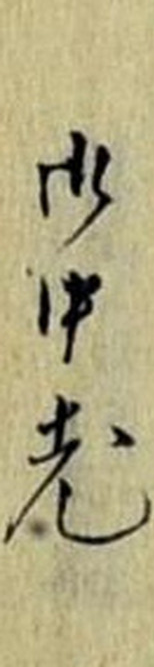御中老
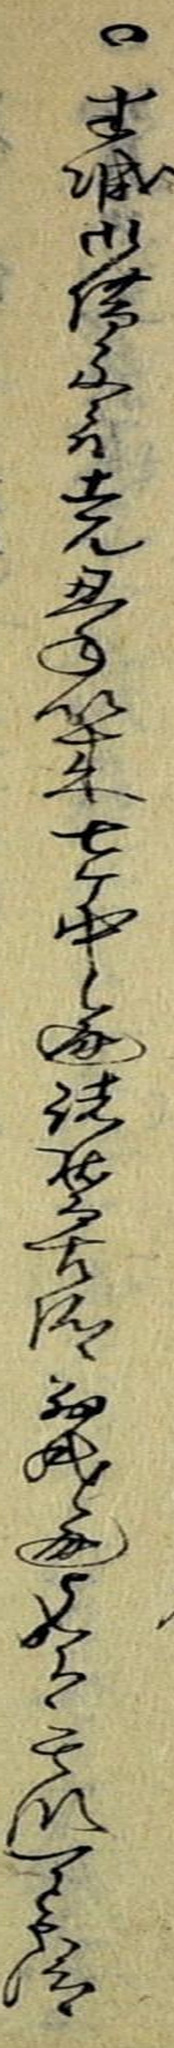○半減御借米に付去ル丑年以来七ヶ中之通諸稽古所へ別紙之通被成下候其段可被申渡候
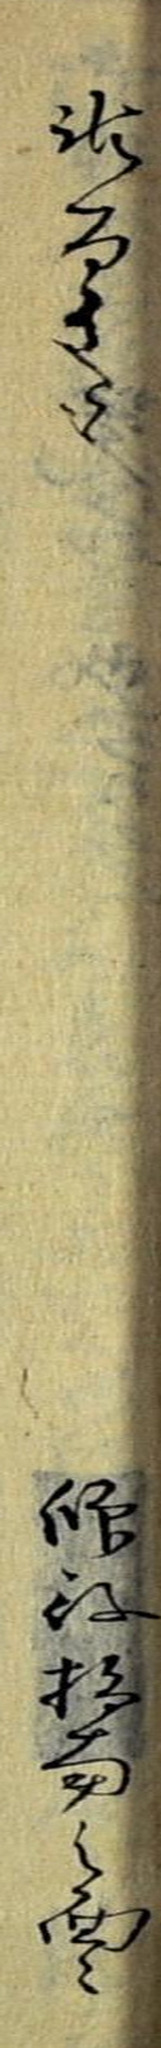銀百匁つヽ師役指南之面々
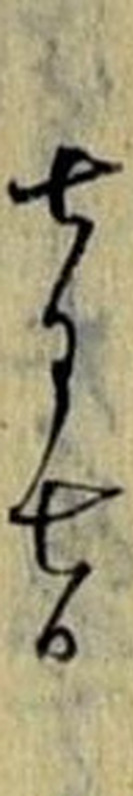七月七日
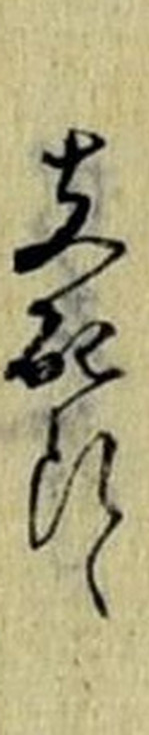支配頭へ
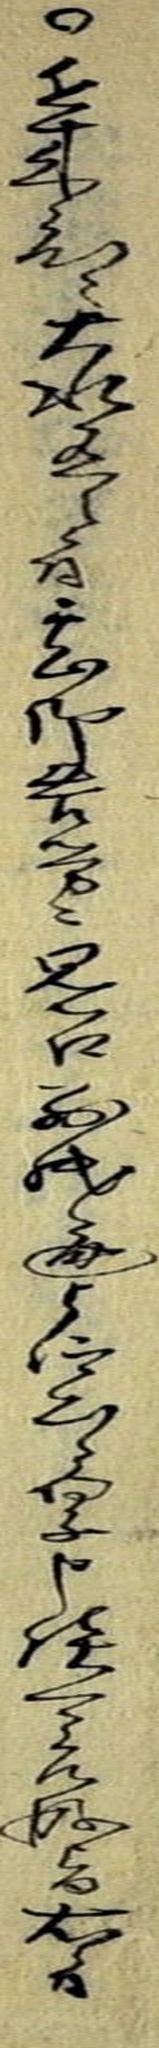○近来度々大水有之に付甚御苦労に思召別紙之通被仰出候厚申談可被取扱旨右に付
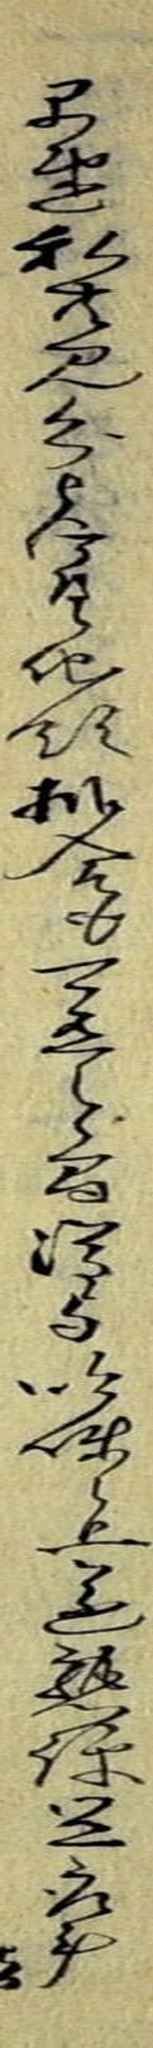早速私共見分被仰付候他領掛合も可有之候間得と吟味之上遂熟評宜取斗旨
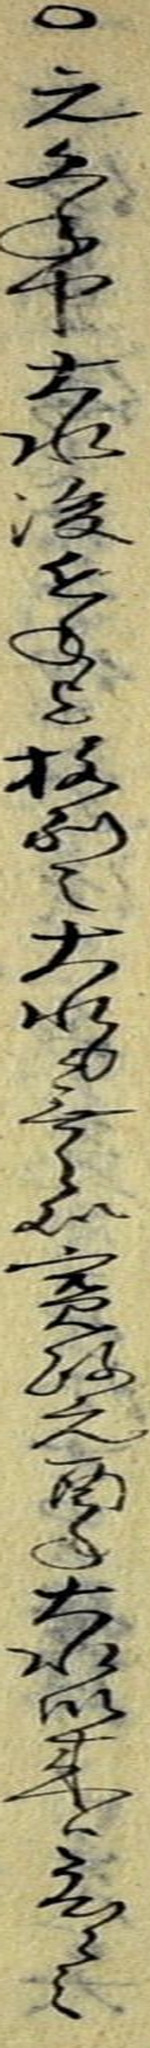○元文年中大水後近年迄格別之大水も無之処寛政元酉年大水以来は度々之
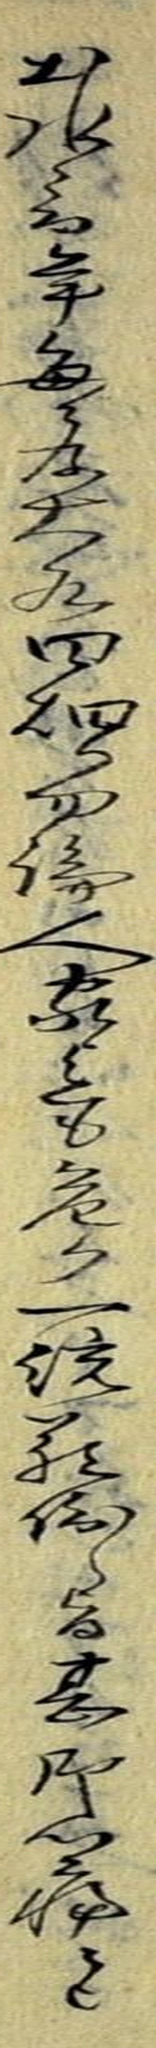出水に而年毎に及大水田畑は勿論人家迄も危く一統難儀之旨甚御心痛に被
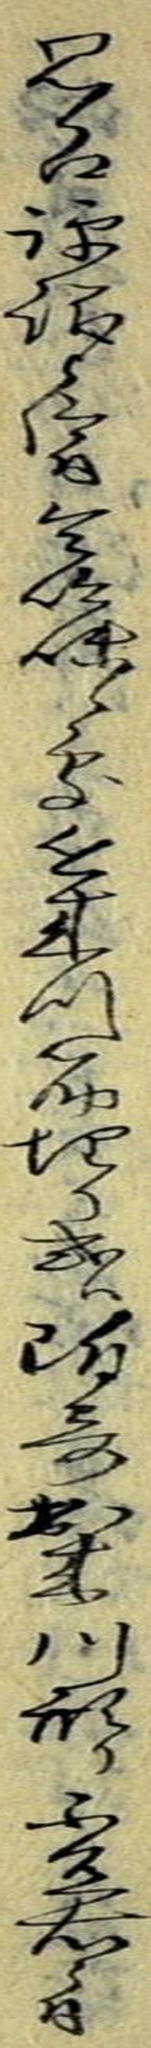思召評議被仰付令吟味候処近来川筋埋り或は附寄出来川形り不宜右に付
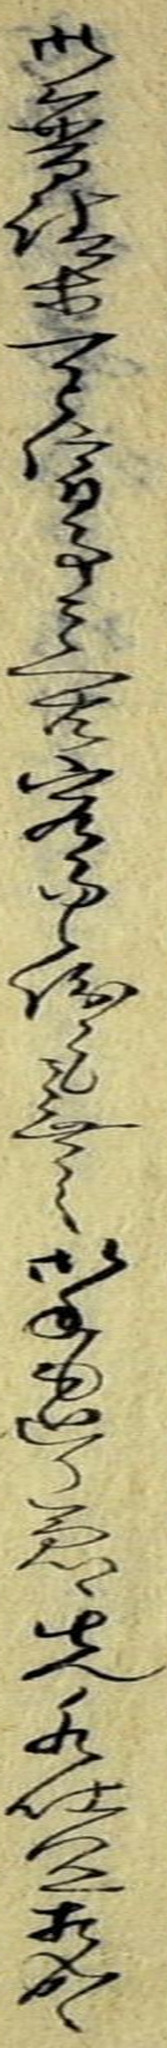御普請等可被仰付事に候へ共究事之儀にも無之御手も廻り兼候先水吐宜相成候
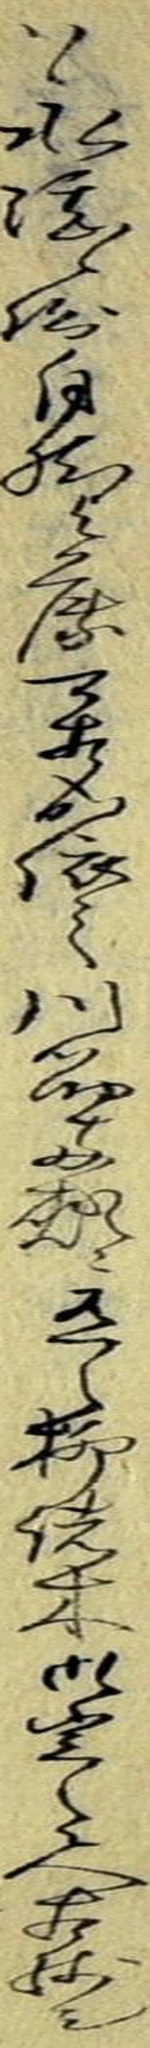はヽ水湛候儀自然と薄可相成依之川筋両頬有之柳諸木御定之尺相残し
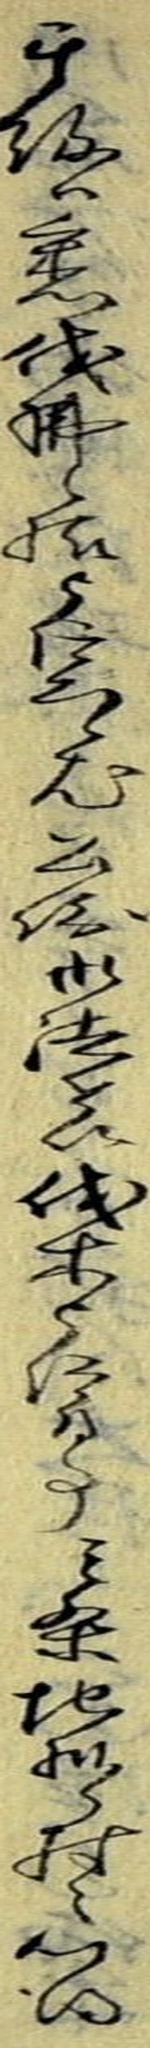其餘は悉伐払候様被仰出候尤公儀御法を以伐木被仰付事に候条地掛り村之心得
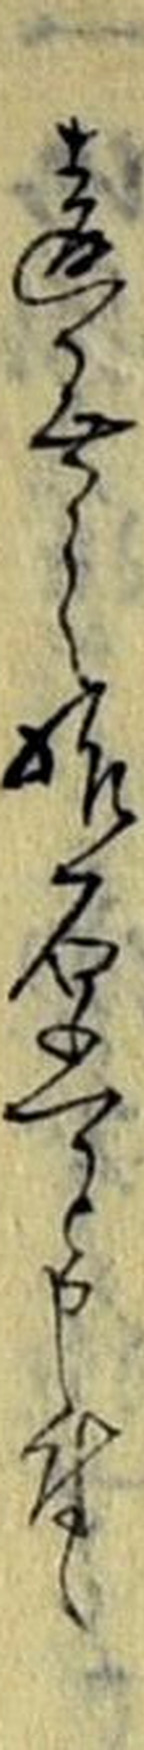違無之様厚可被申付候

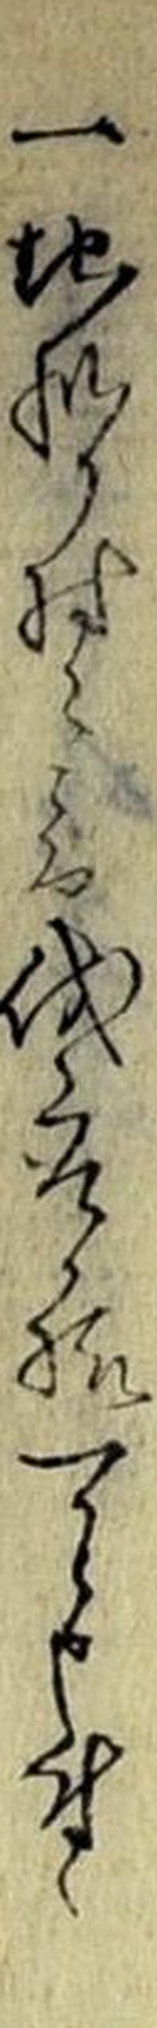一地掛り村々に而伐取候様可被申付候
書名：命令之部 四
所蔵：福井県文書館 Fukui Prefectural Archives
